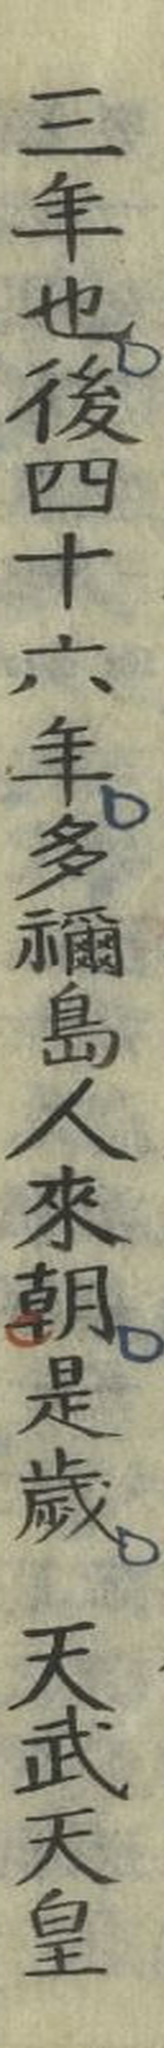三年也。後四十六年。多禰島人來朝。是歲。天武天皇
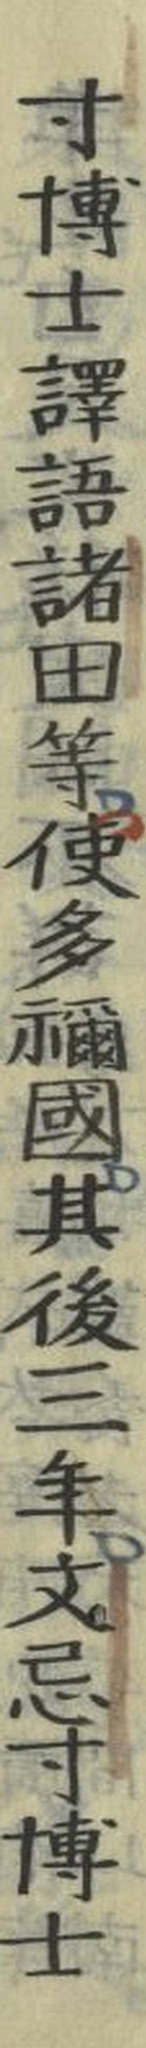寸博士譯語諸田等。使多禰國。其後三年。文忌寸博士
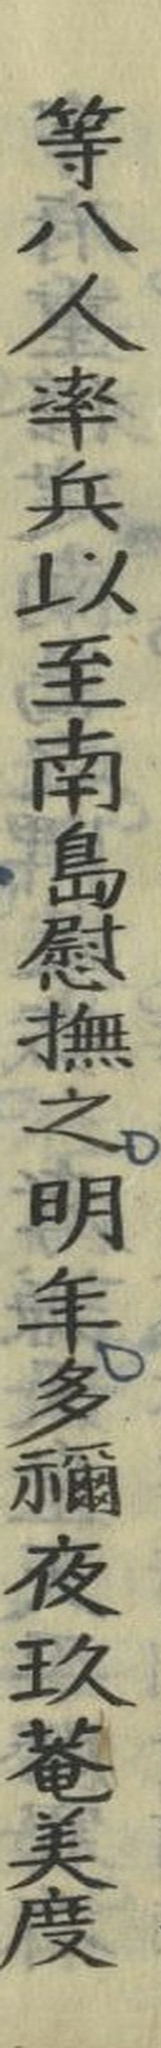等八人率兵以至南島慰撫之。明年。多禰夜玖菴美度
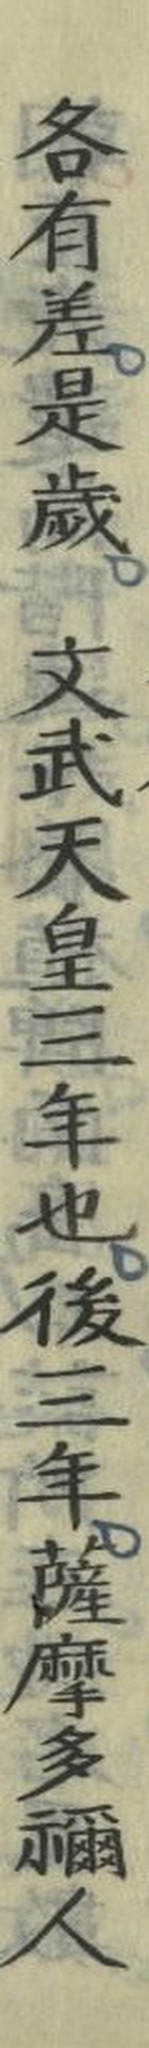各有差。是歲。文武天皇三年也。後三年。薩摩多禰人
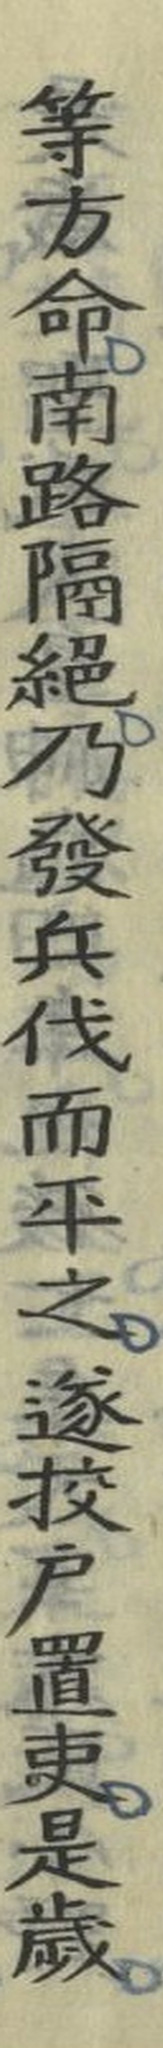等方命。南路隔絕。乃發兵伐而平之。遂挍戸置吏。是歲。
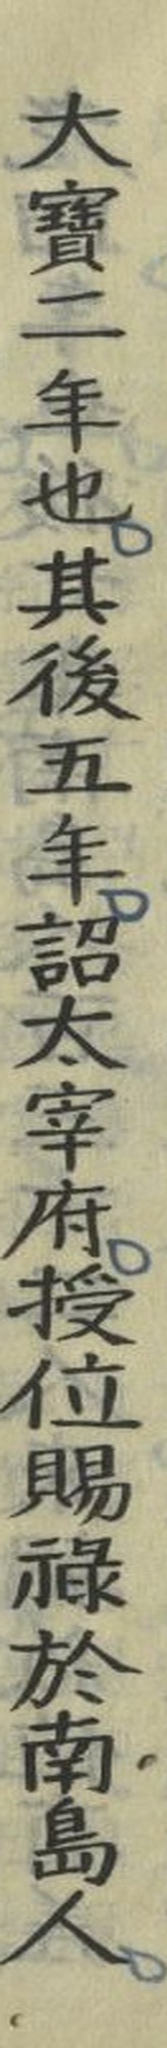大寶二年也。其後五年。詔太宰府。授位賜祿於南島人。
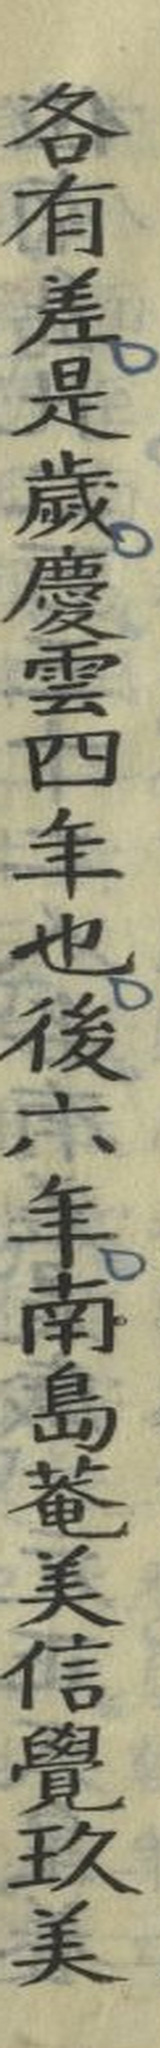各有差。是歲。慶雲四年也。後六年。南島菴美信覺玖美
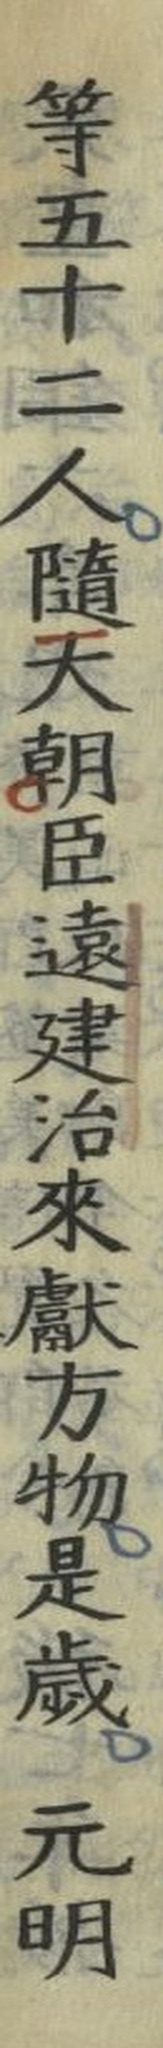等五十二人。隨大天朝臣遠建治來獻方物。是歲。元明

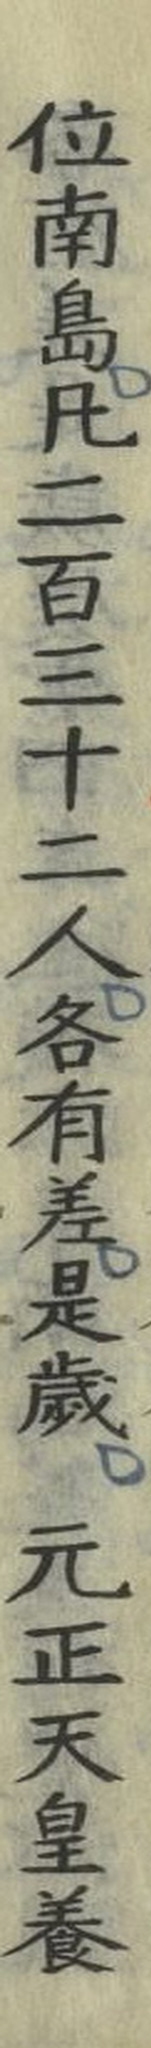位南島。凡二百三十二人。各有差。是歲。元正天皇養
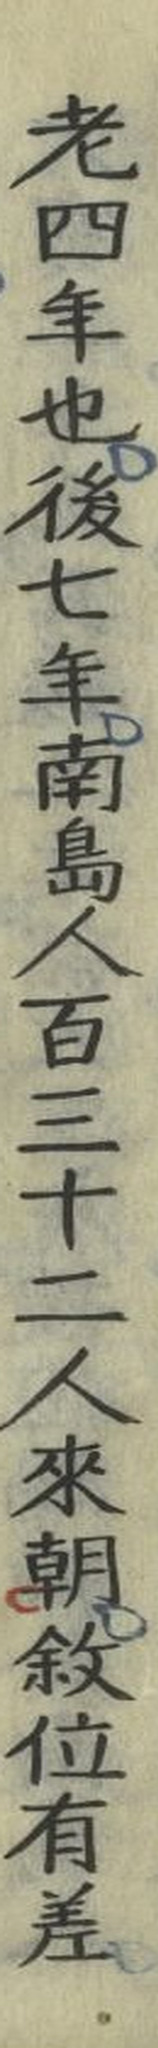老四年也。後七年。南島人百三十二人來朝。叙位有差。
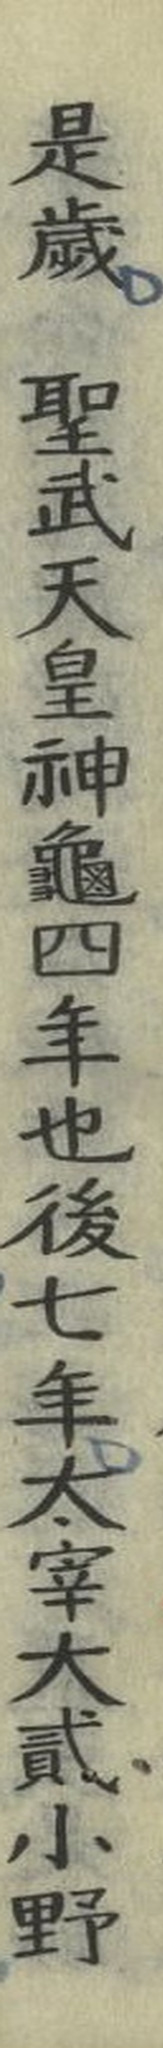是歲。聖武天皇神龜四年也後七年。太宰大貳小野
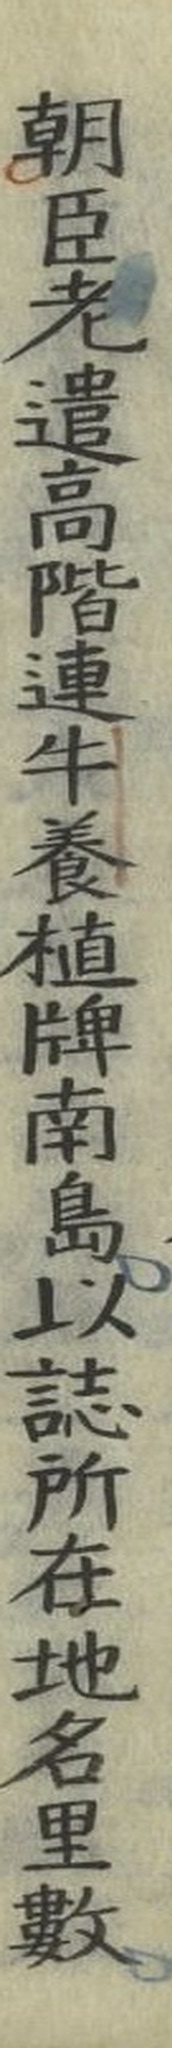朝臣老遣高階連牛養植牌南島。以誌所在地名里數。
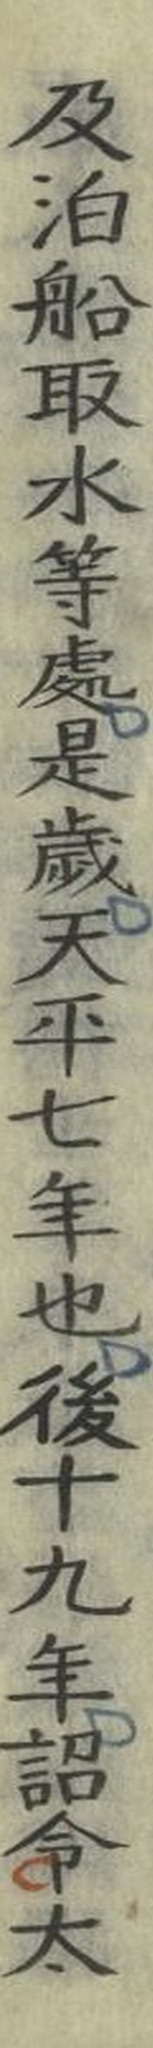及泊船取水等處。是歲。天平七年也。後十九年。詔令太
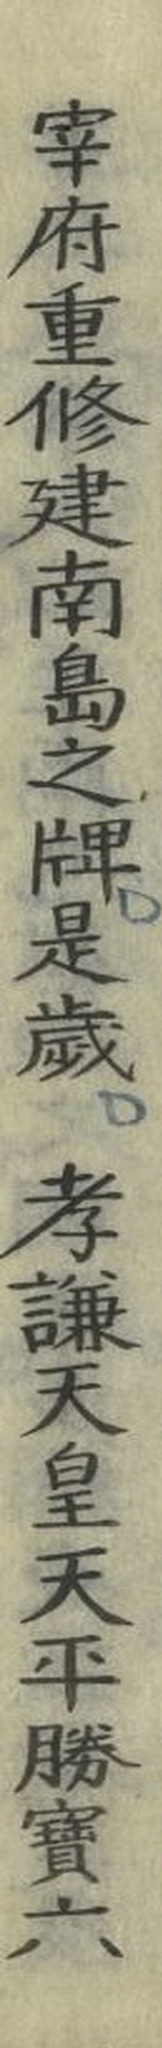宰府重修建南島之牌。是歲。孝謙天皇天平勝寶六
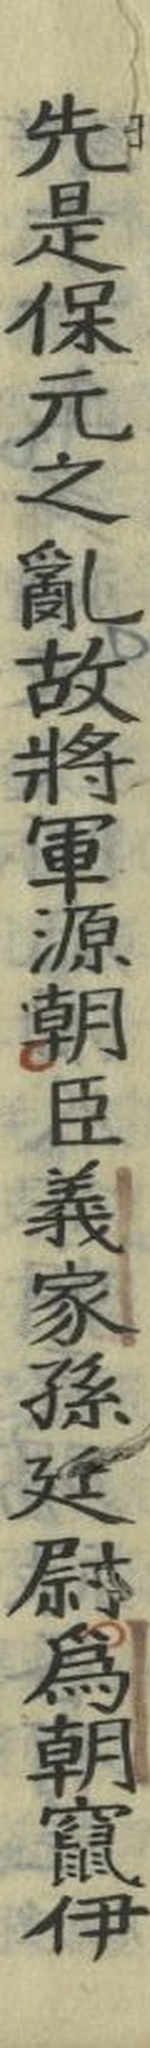先是保元之亂。故將軍源朝臣義家孫廷尉爲朝竄伊
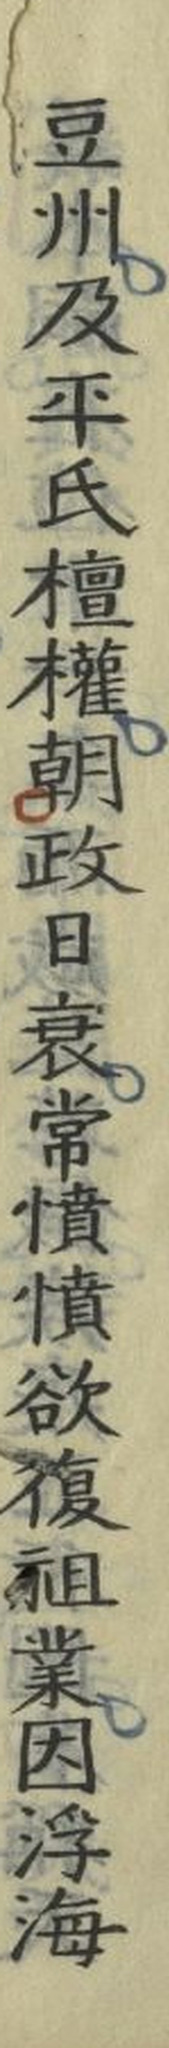豆州。及平氏檀權。朝政日衰。常憤憤欲復祖業。因浮海
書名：南島志
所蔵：University of the Ryukyus Library
